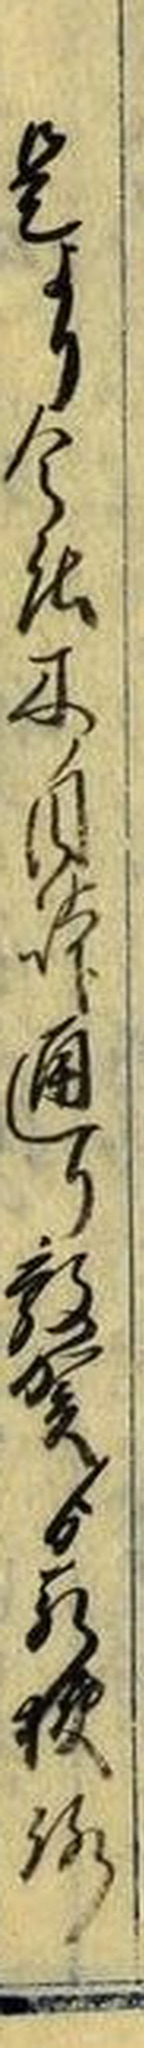是より今庄木ノ目峠通り敦賀ゟ若狭路
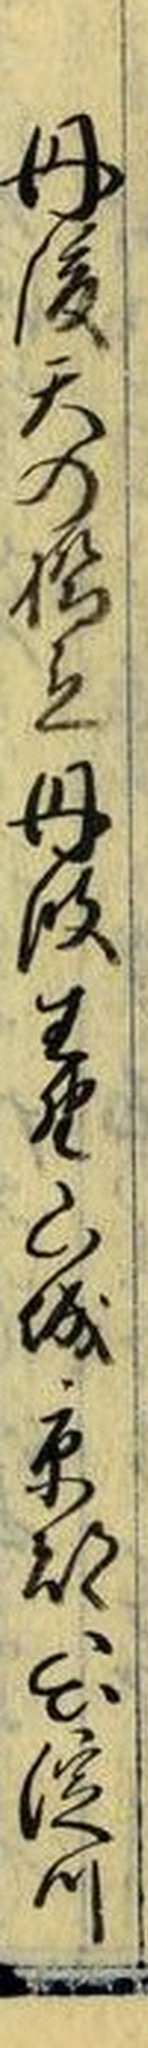丹後天の橋立丹波生野山城京都へ出淀川
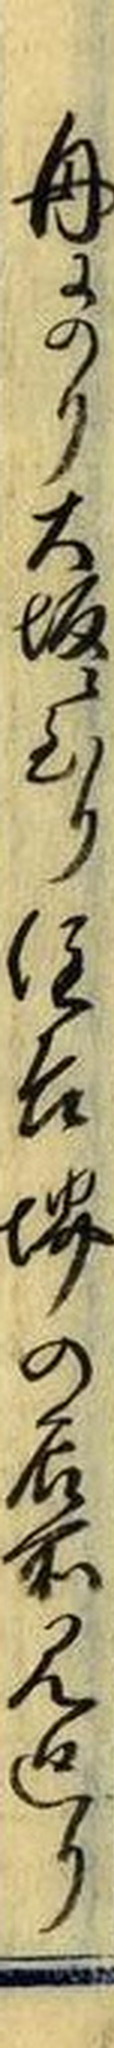舟にのり大坂に至り住吉堺の名所見廻り
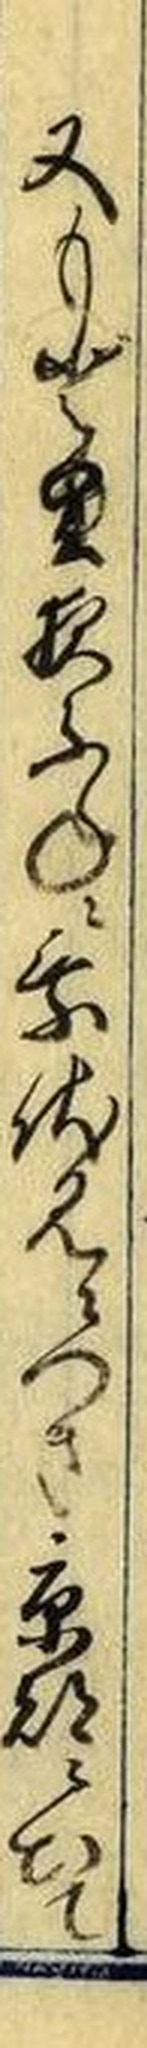又もとり夜ふねに乗伏見につき京都に出て
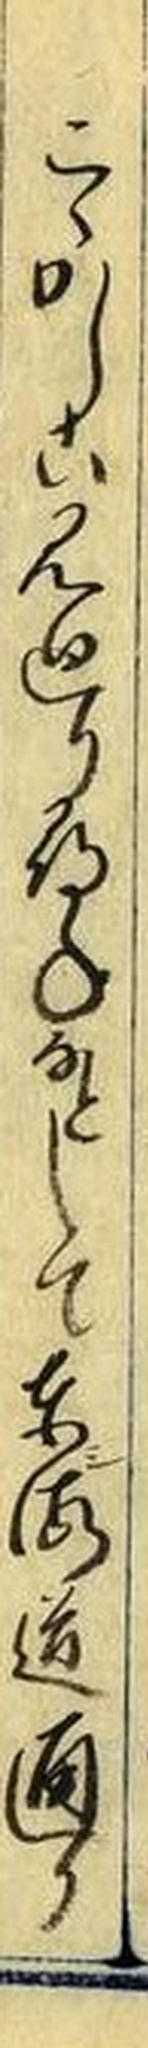こゝかしこ見廻り尋ねなとして東し海道通り
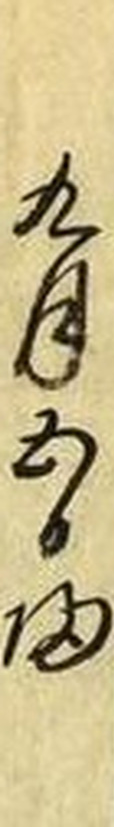九月五日帰
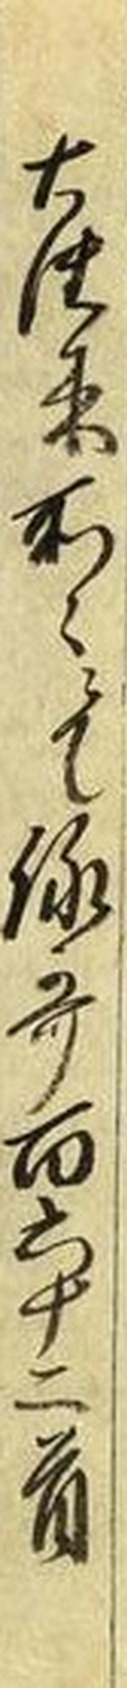右往来所々にて詠哥百六十二首
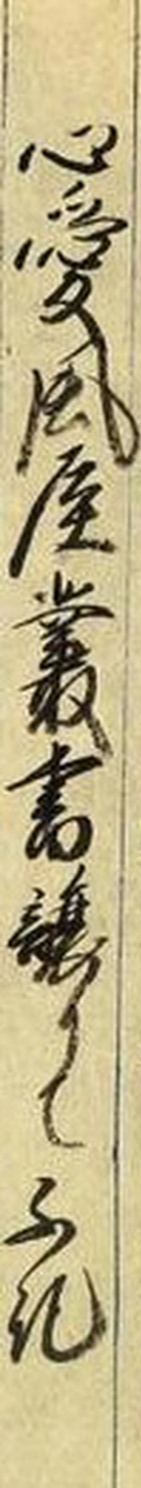心愛風屋叢書譲りて不記
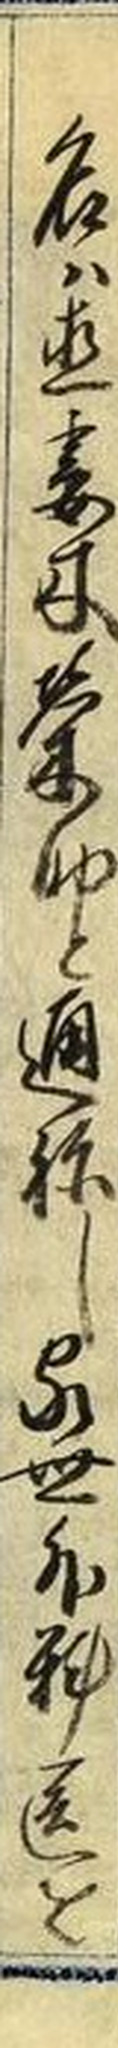名は直妻木榮助と通称し家世外科医を
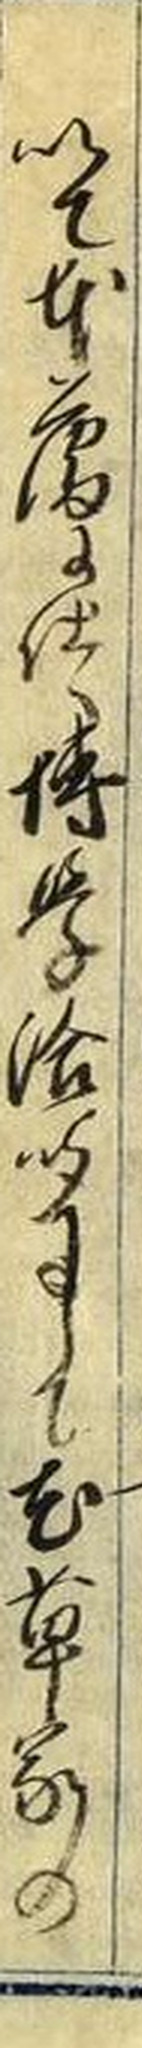以て本藩に仕へ博學洽聞にして本草家の
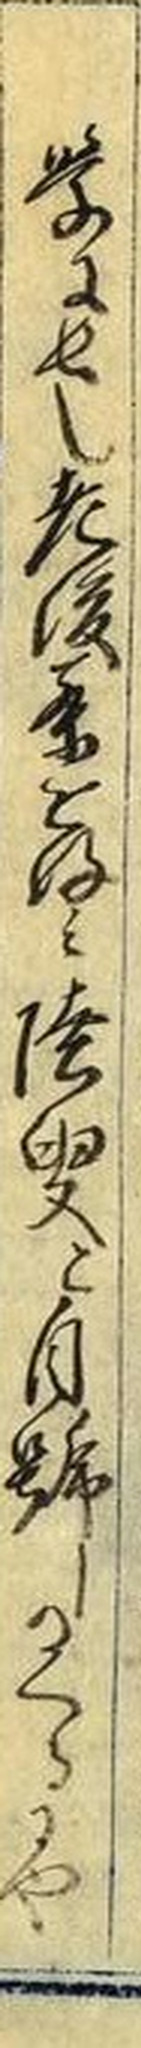學に長し老後茶を好み陸叟と自號し給へるにや

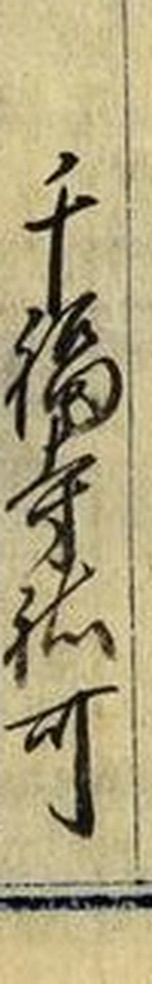千福寺祐可
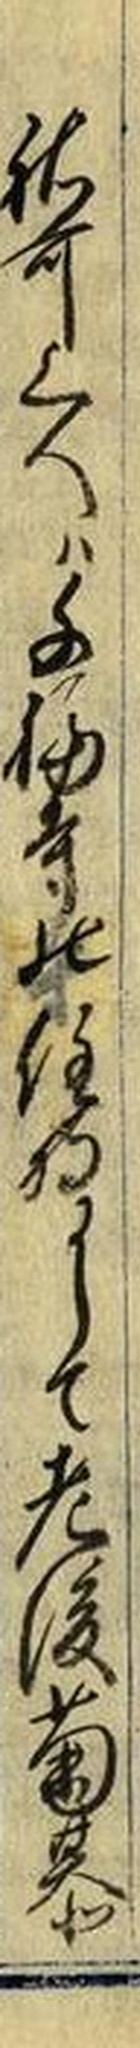祐可上人は千福寺の住持にして老後菊恭
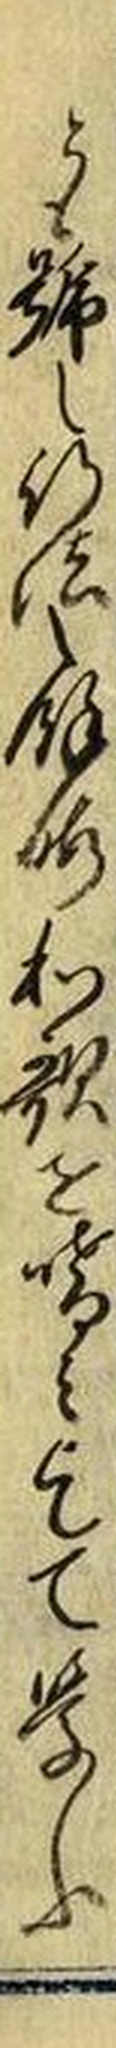とも号し行法之余暇和歌を嗜み乞て学ふ
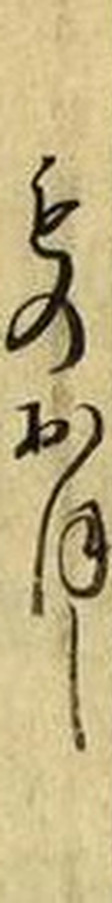ものおほし
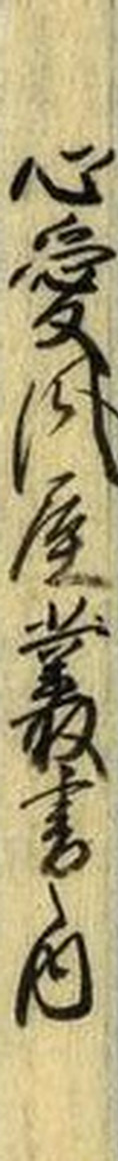心愛風屋叢書之内
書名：温古集 三巻
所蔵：福井県文書館 Fukui Prefectural Archives
